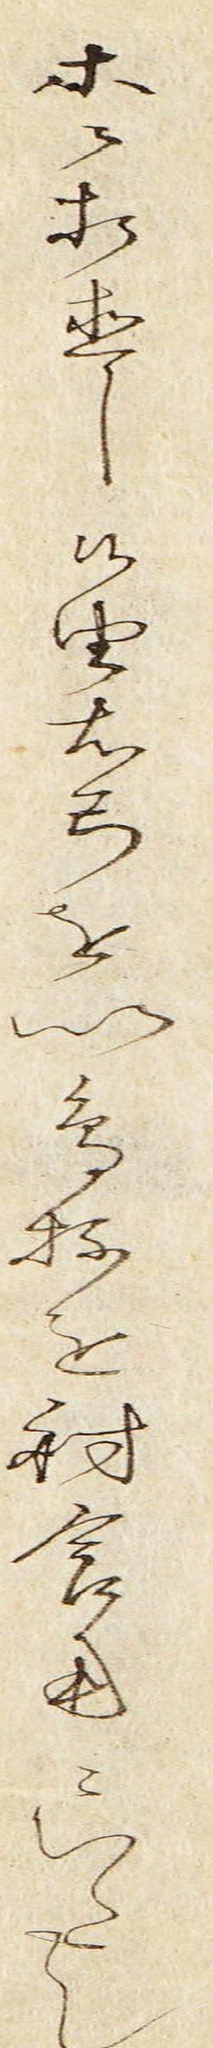等に相直し候由右弓を以鳥抔を射食用にいたし

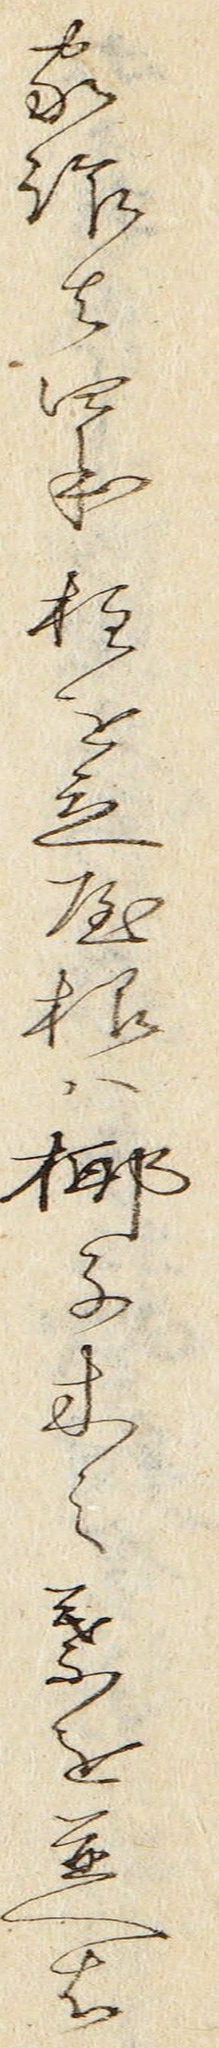家作は四本柱を立て屋根は椰子木之葉を並へ右
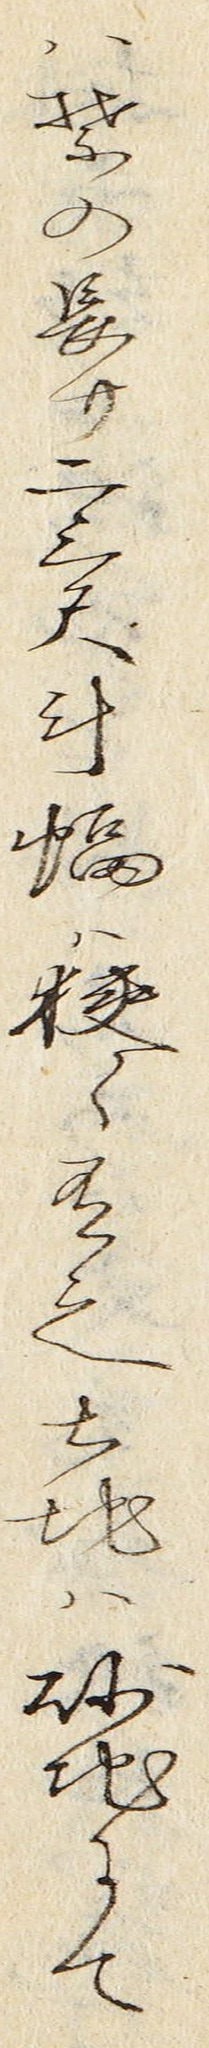は葉の長さ二三尺計幅は狭く有之土地は砂地にて
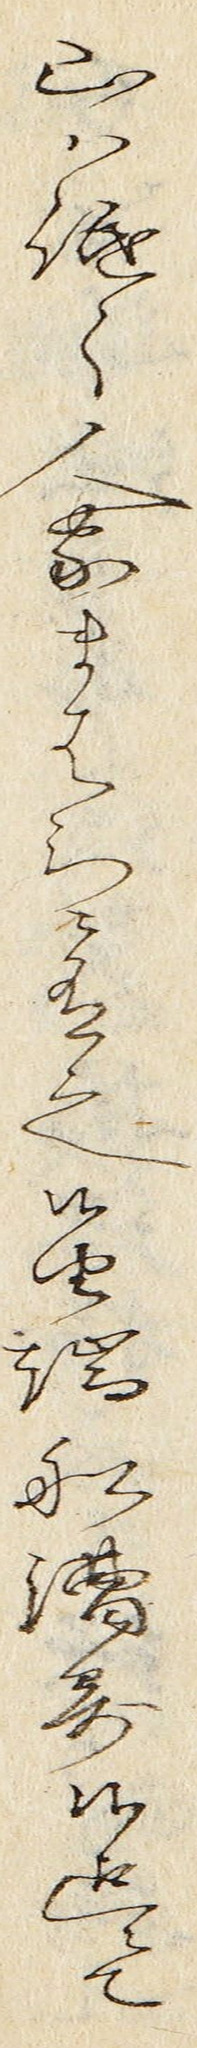山は低く人家まはらに有之候由端船漕寄候迄にて
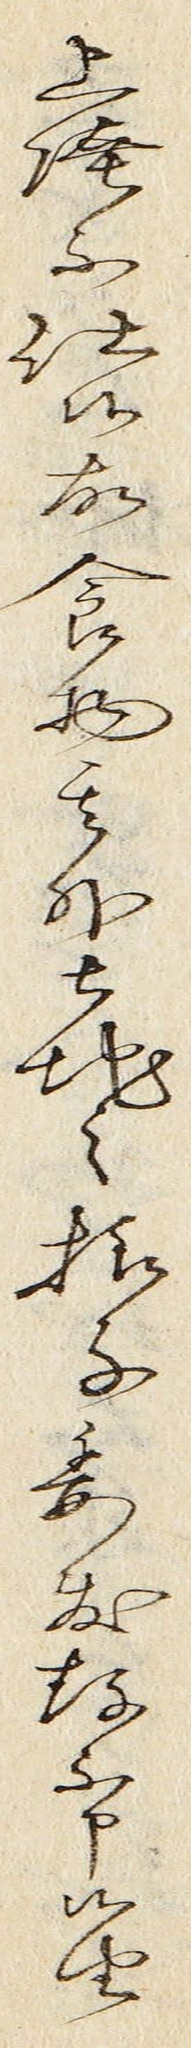上陸不仕候故食物其外土地之様子委敷存不申候由
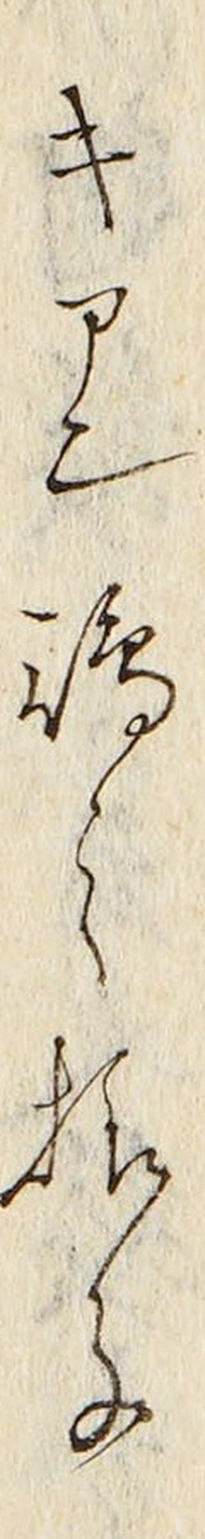キアン嶋之様子
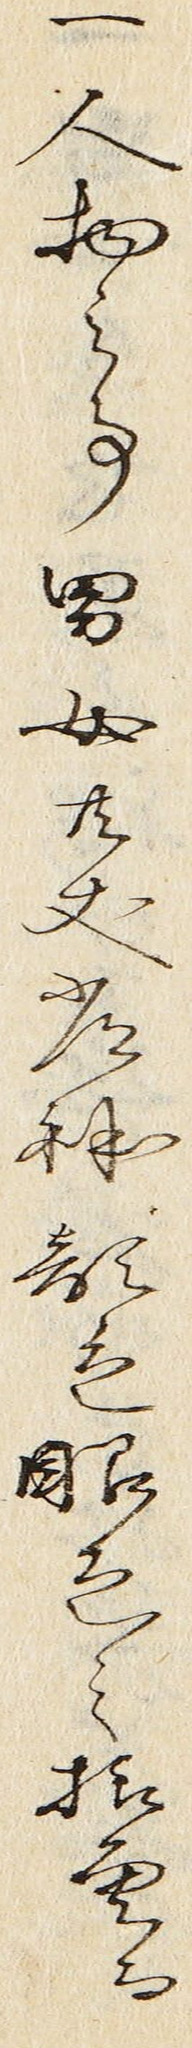一人物之事男女共丈常躰顔色眼色之様差而
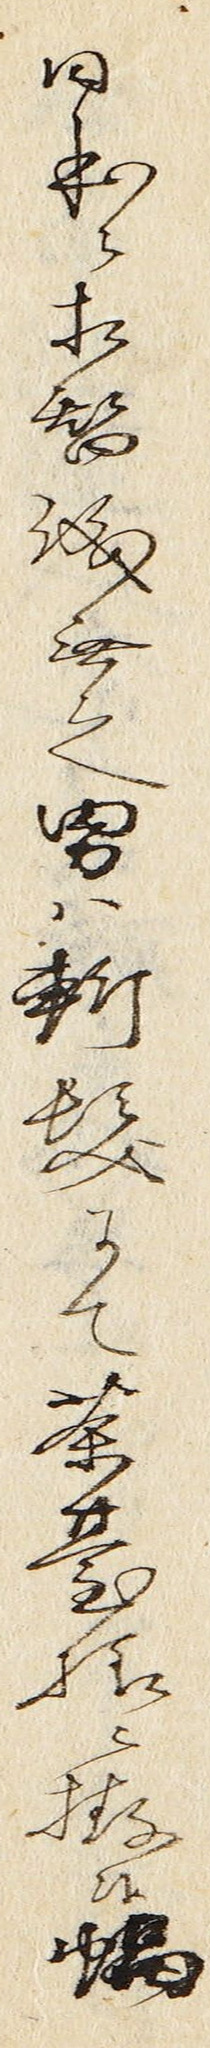日本に相替儀無之男は斬髪にて茶台様に拵候帽
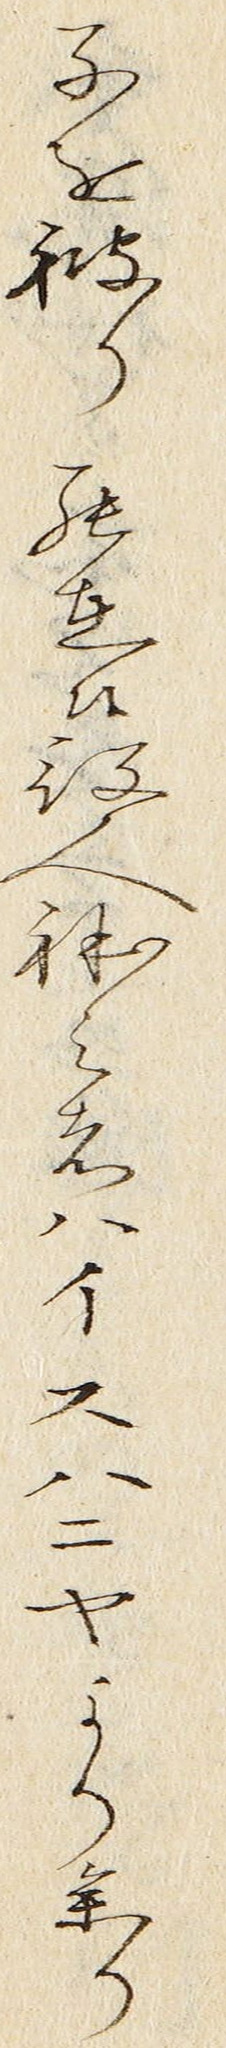子を被り罷在候役人躰之者はイスハニヤより参り
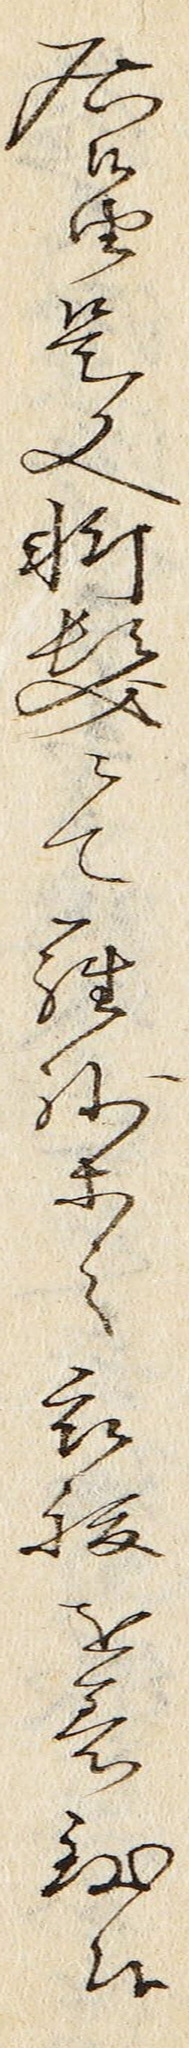居候由是又斬髪にて羅紗等之衣服を着致候
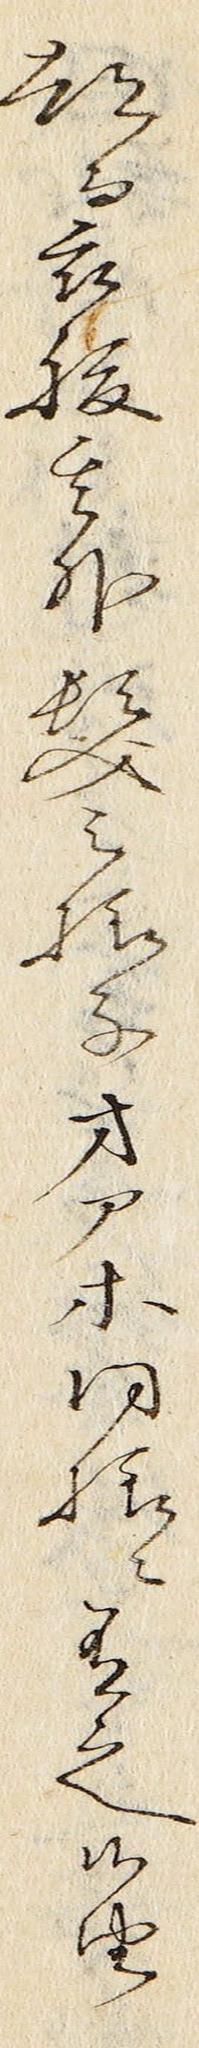都而衣服其外髪之様子オアホ同様に有之候由
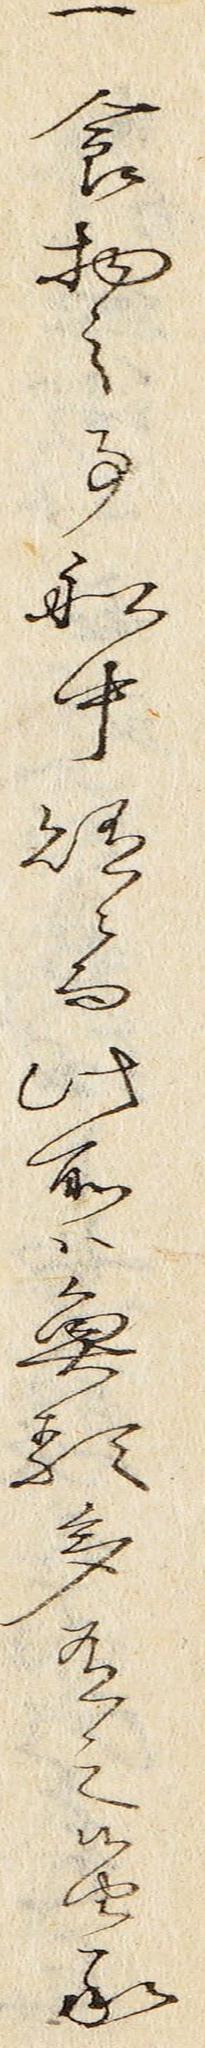一食物之事船中賄に而此所は魚類多有之候由承
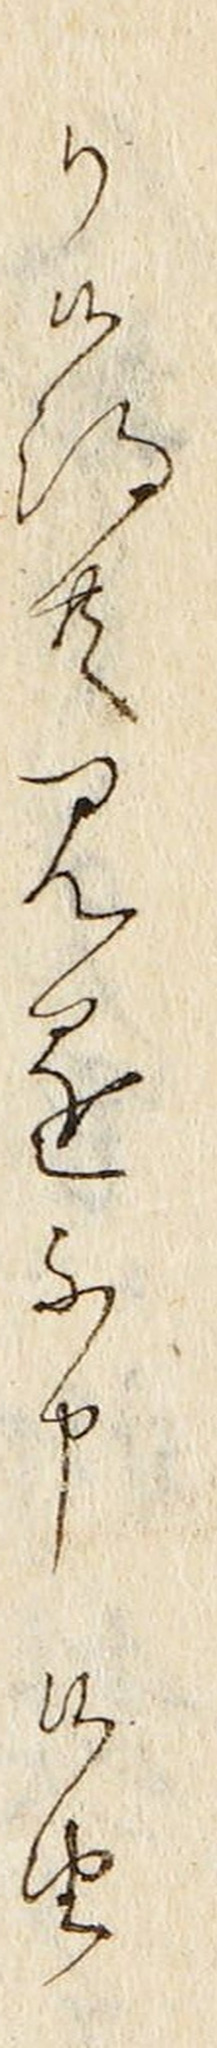り候得共見懸不申候由
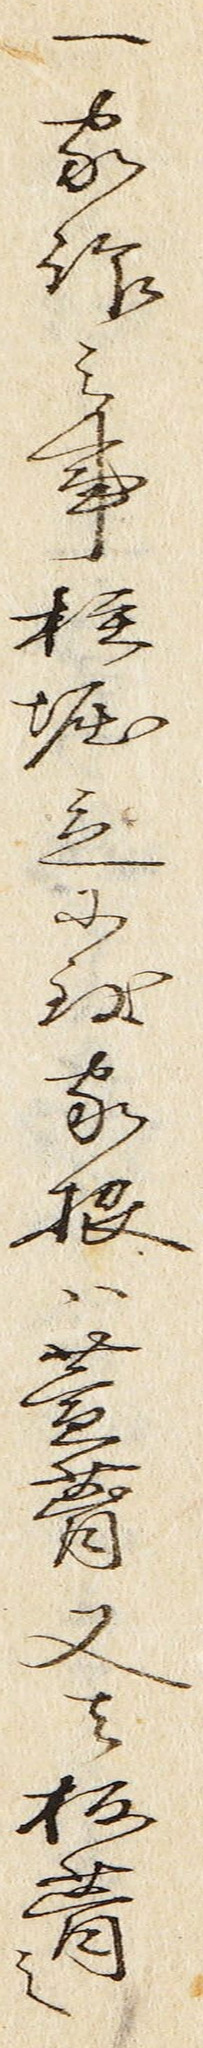一家作之事柱堀立に致家根は萱葺又は板葺之
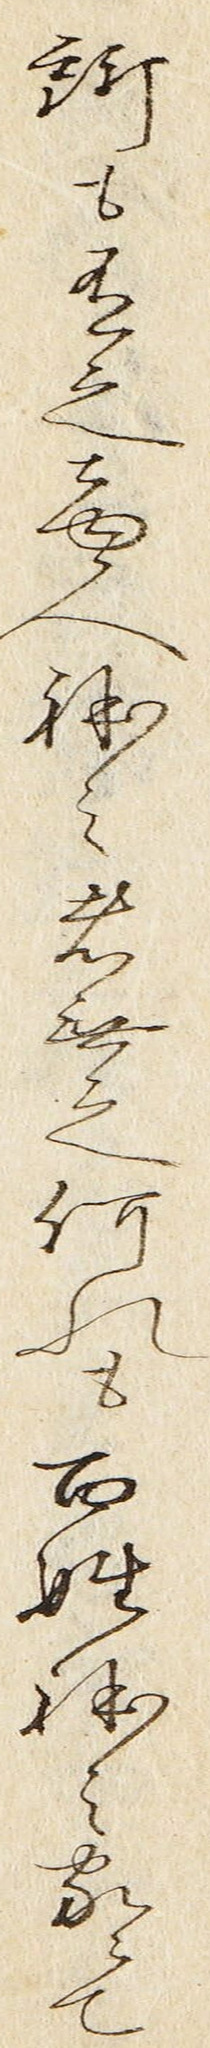所も有之商人躰之者無之何れも百姓躰之家にて
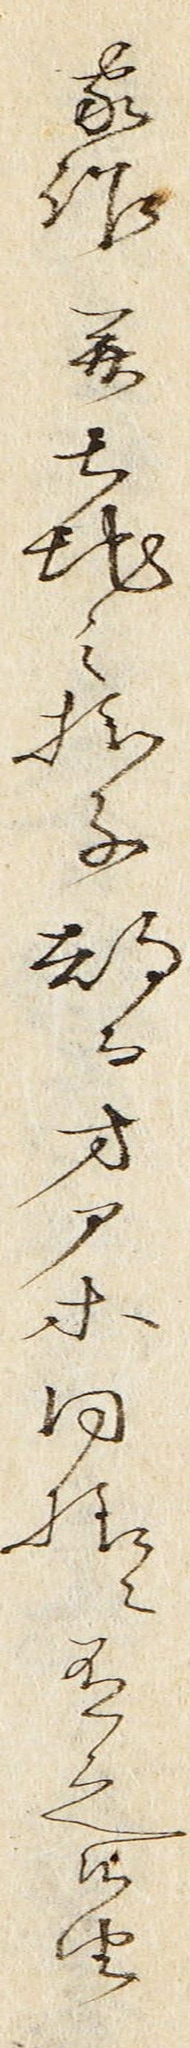家作并土地之様子都而オアホ同様に有之候由
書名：土佐中浜万次郎漂流記
